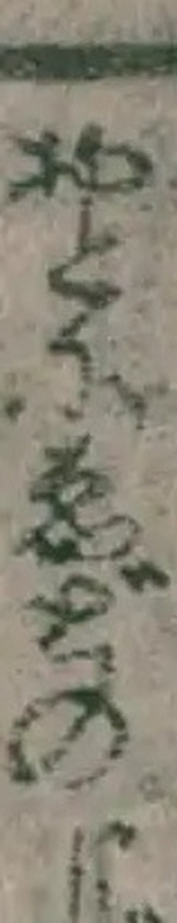おとにゑどの
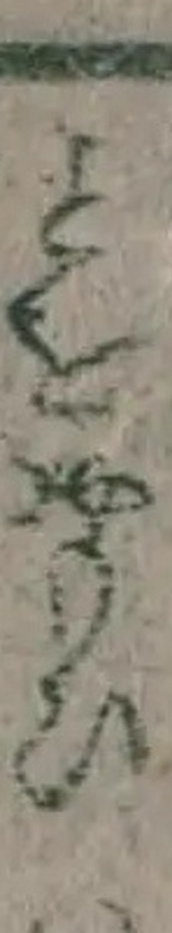ことをおもひ
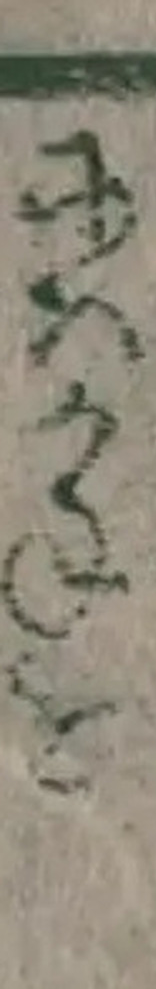にはかねを
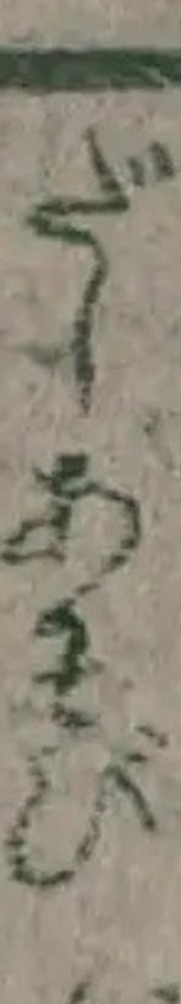だしあそび
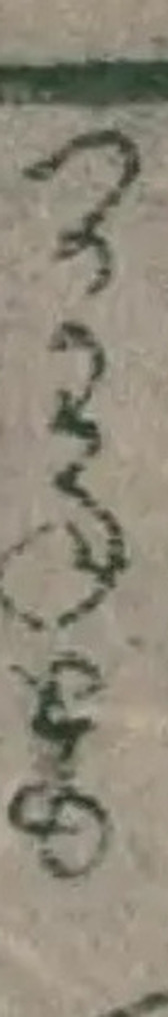つかわねども
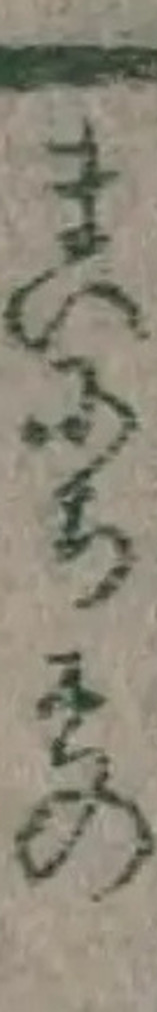まいにちその
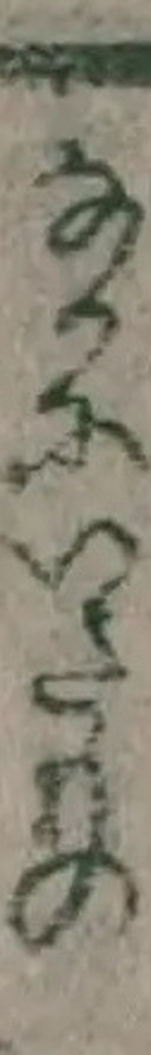なかにいたもの
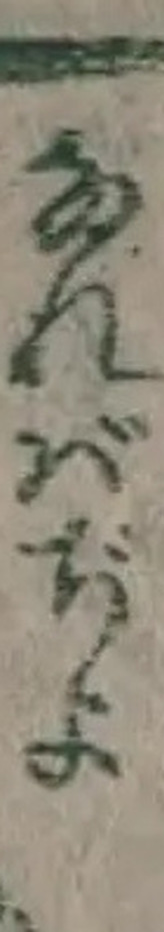なればぢよ
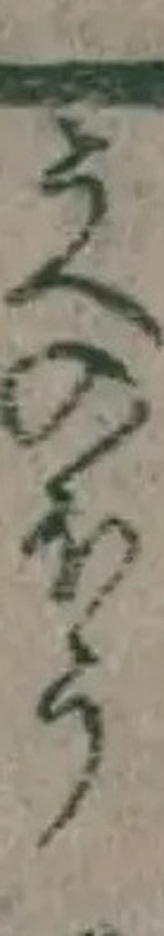うへのほう
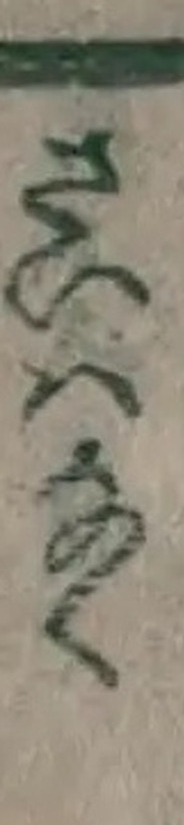さいはなく
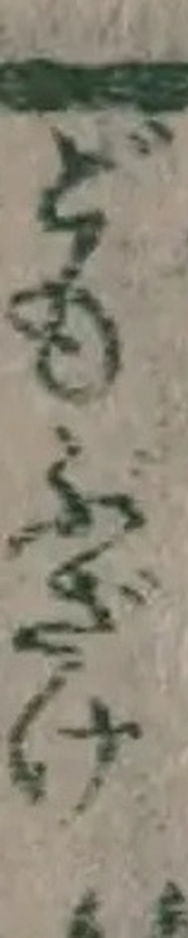どもふざけ
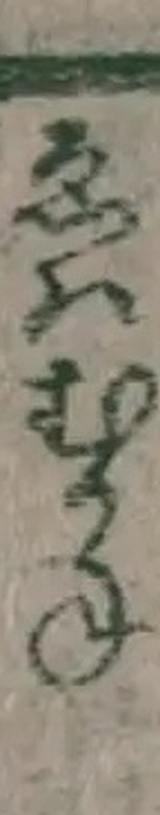ゑはむかね
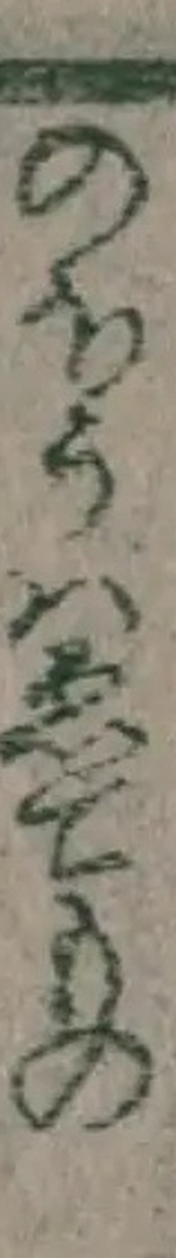のほうはゑてもの
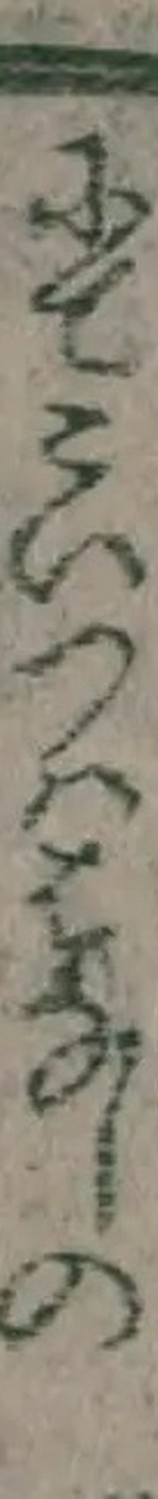にてこいつははなしの
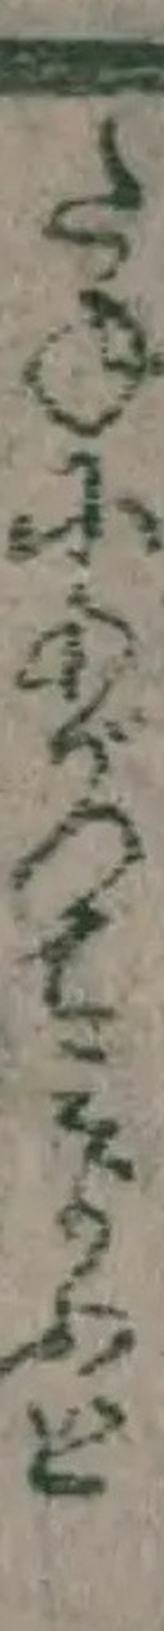たねにあがつてみよふと
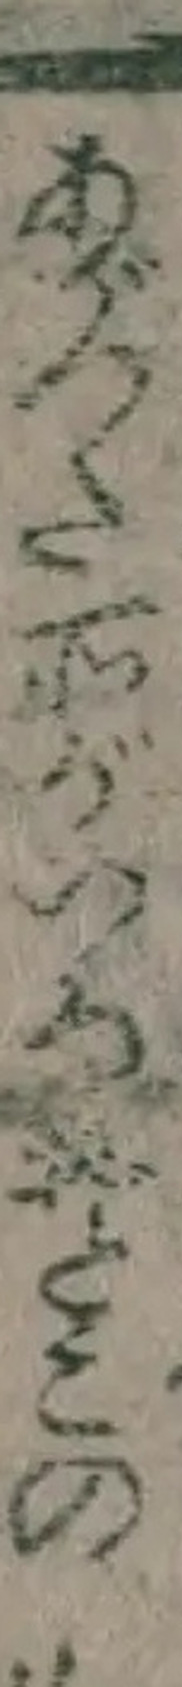あがつた所がいろおとこの
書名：縦筒放唐の噺 3巻
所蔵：国立国会図書館 National Diet Library, JAPAN
